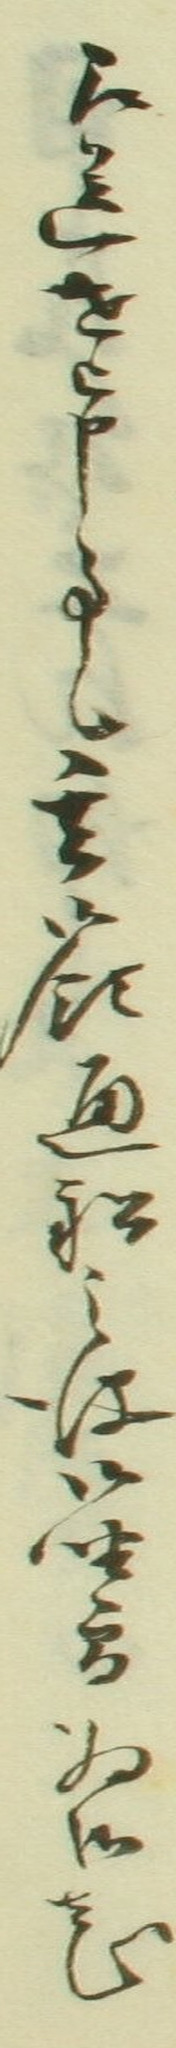江送遣被申事候其御領通船之儀御坐候間為御走

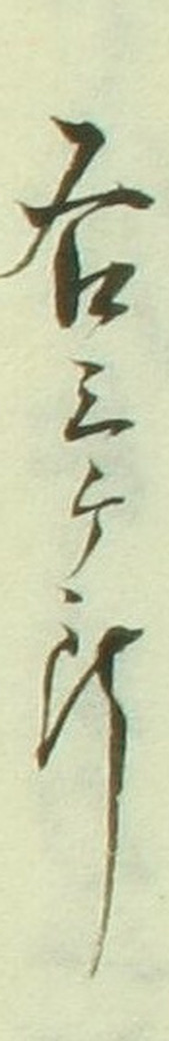右三ヶ所
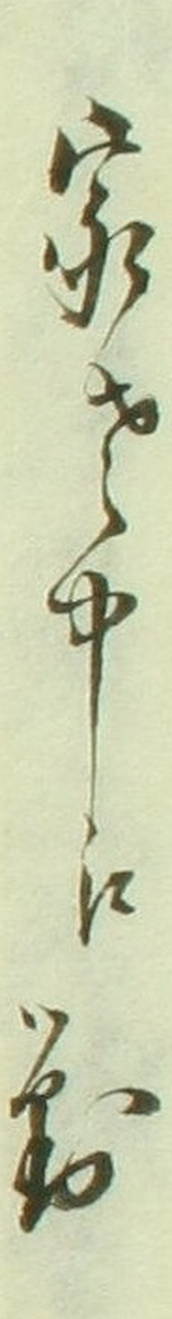家老中江勤
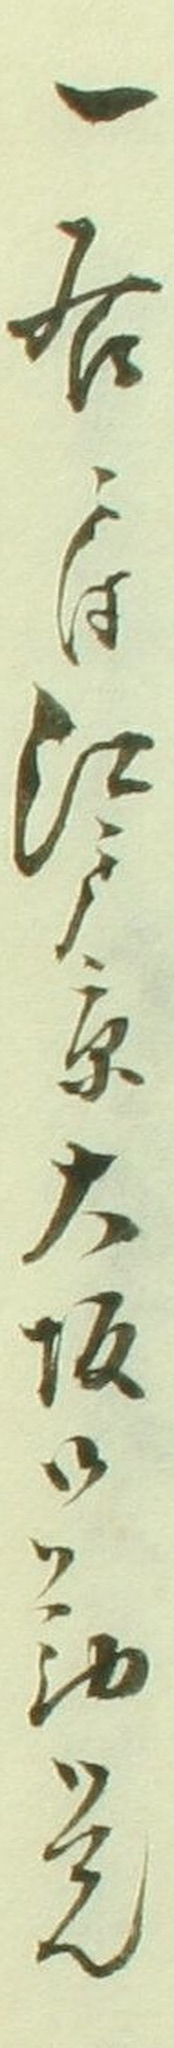一右ニ付江戸京大坂御勤覚
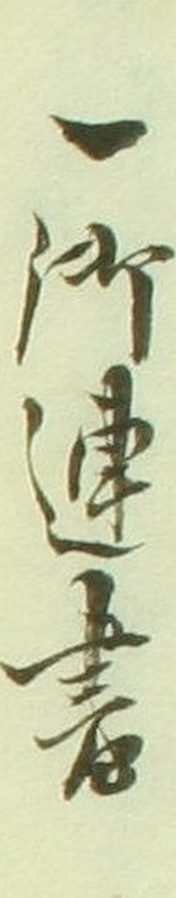一御連書
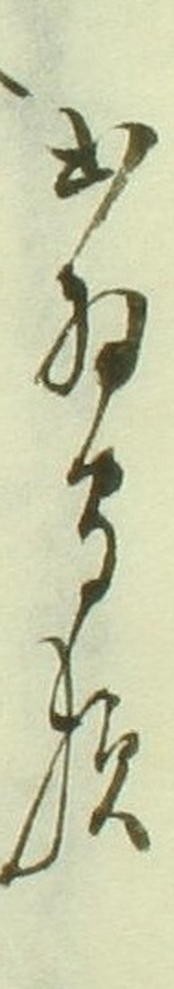出羽守様
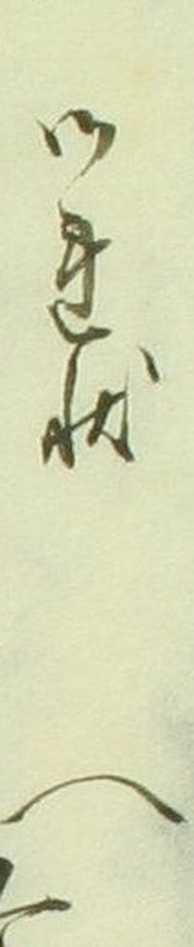御連状
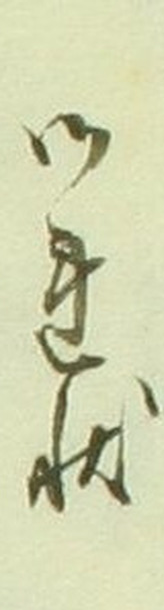御連状
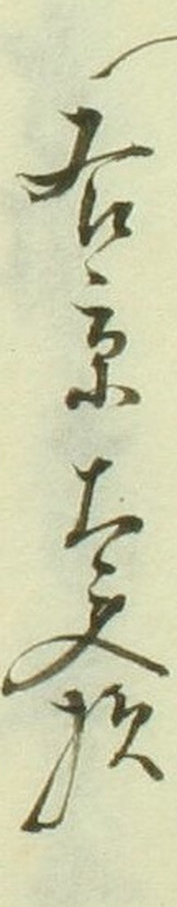右京大夫様
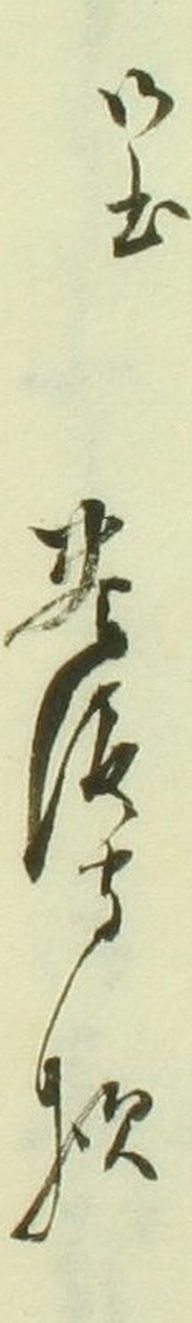御書豊後守様
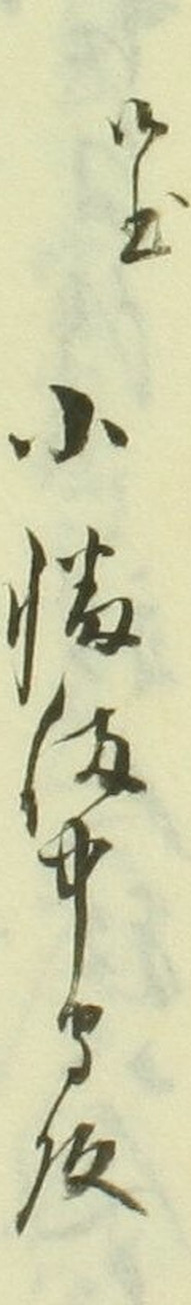御書小幡備中守殿
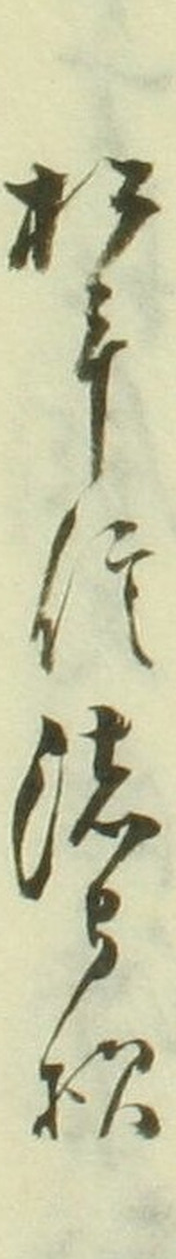同松平信濃守様
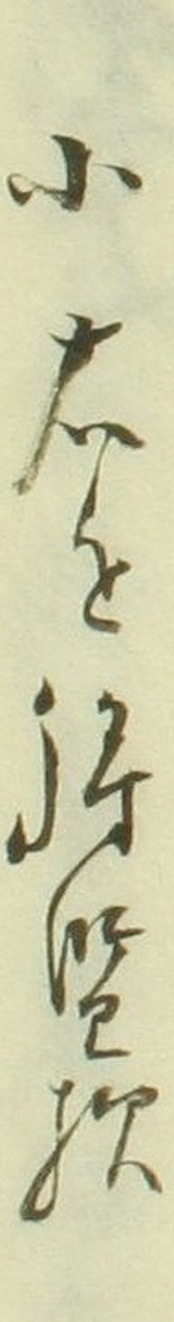同小右近将監様
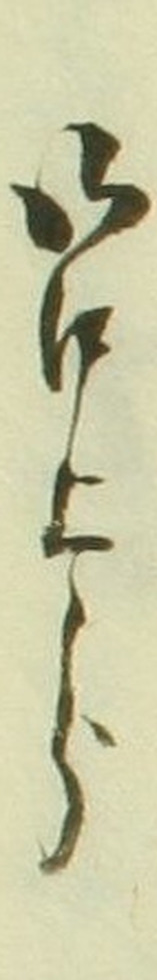御口上分
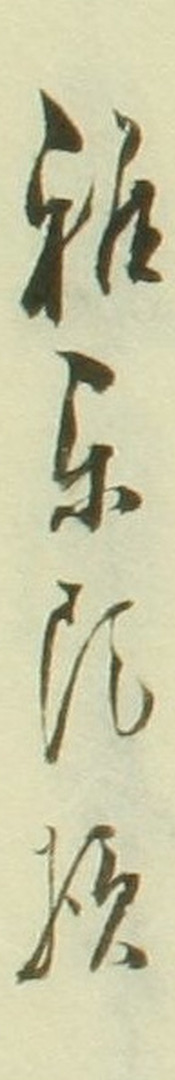雅楽頭様
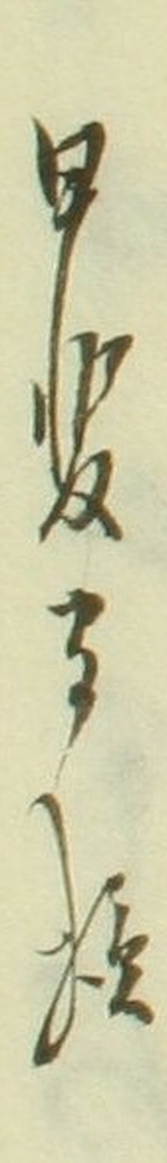甲斐守様
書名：異国船漂着記
